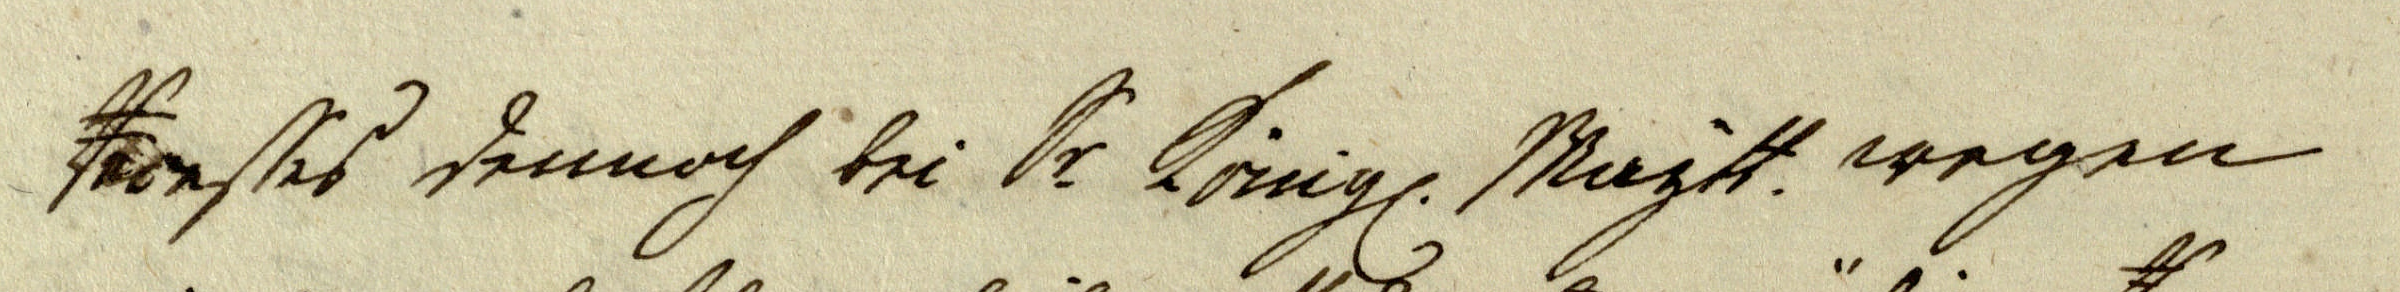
Recesses dennoch bei Sr Königl. Maÿtt. wegen
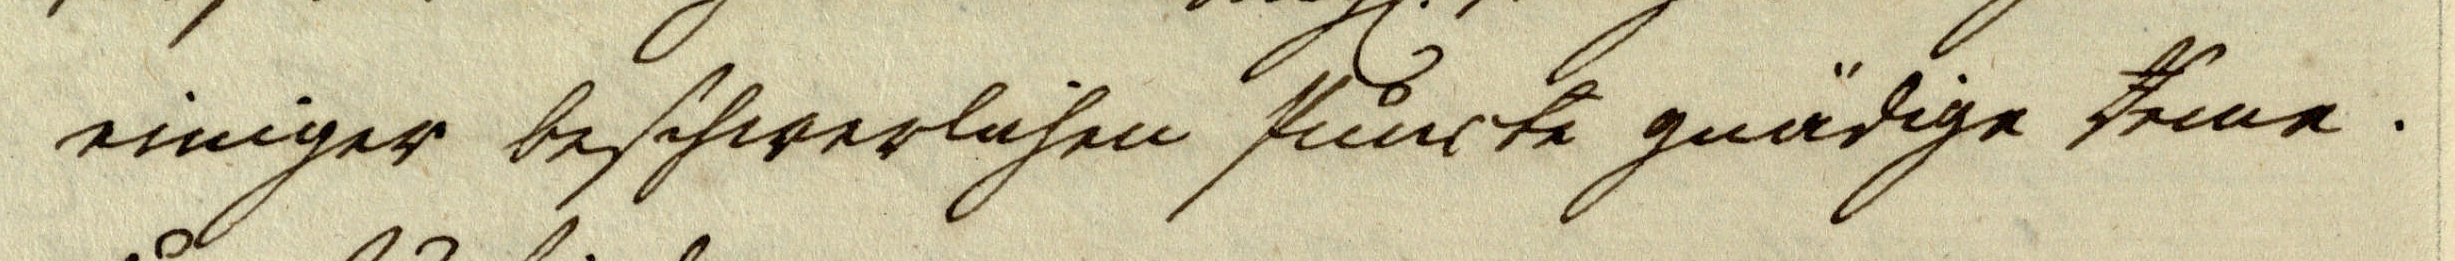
einiger beschwerlichen Puncte gnädige Reme¬
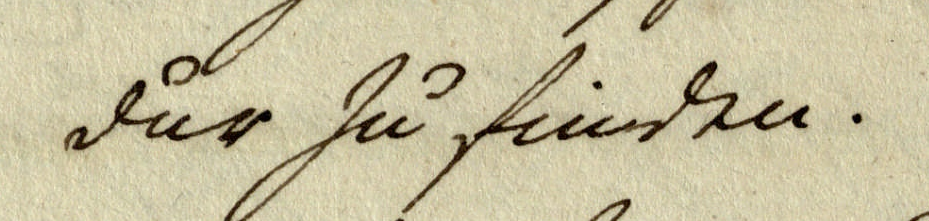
dur zu finden.
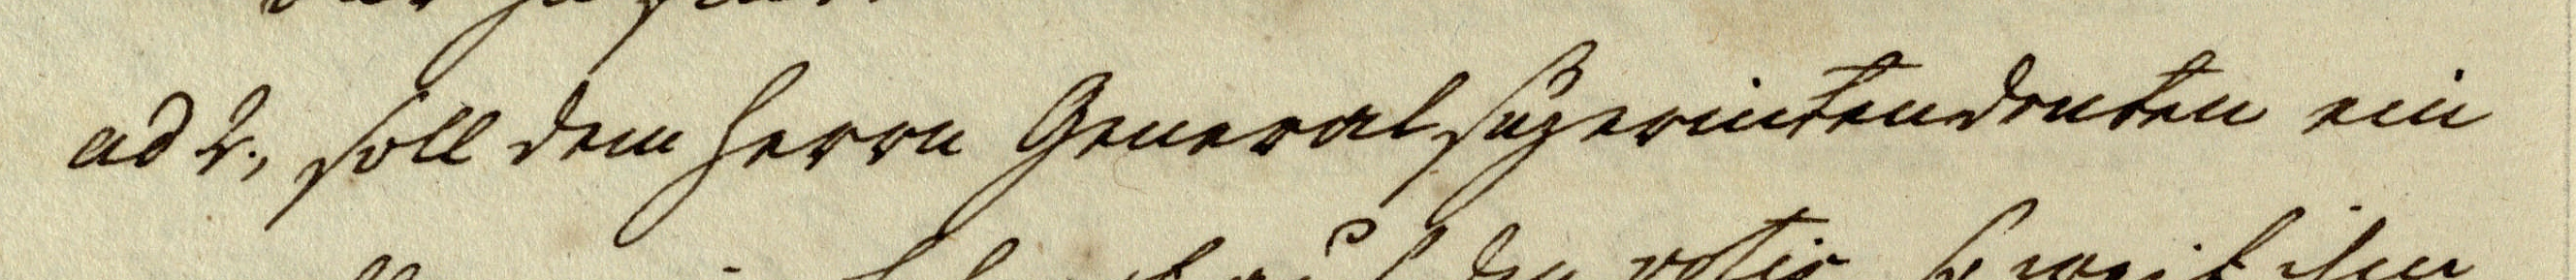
ad 2., soll dem Herrn Generalsuperintendenten ein
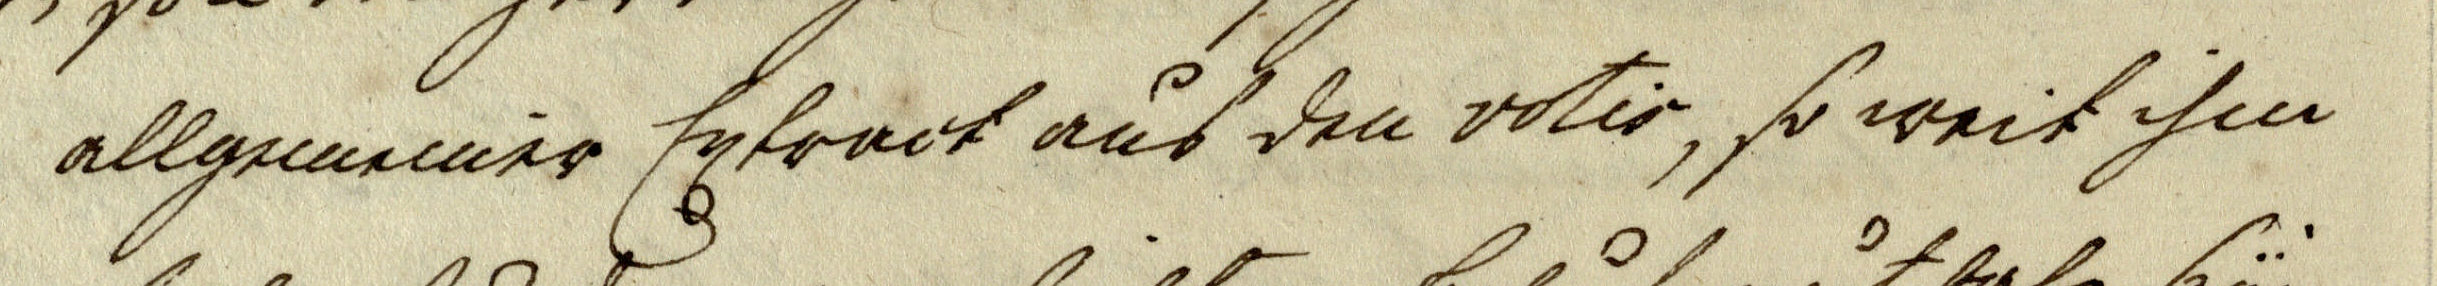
allgemeiner Extract aus den votis, so weit ihm
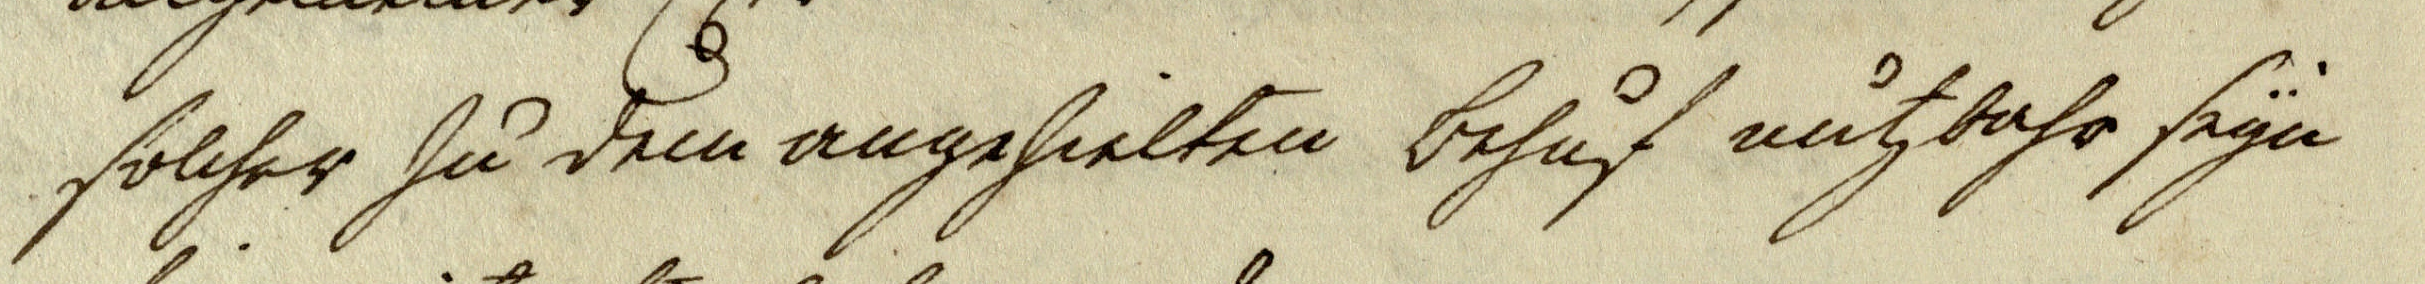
solcher zu dem angezielten Behuf nutzbahr seÿn
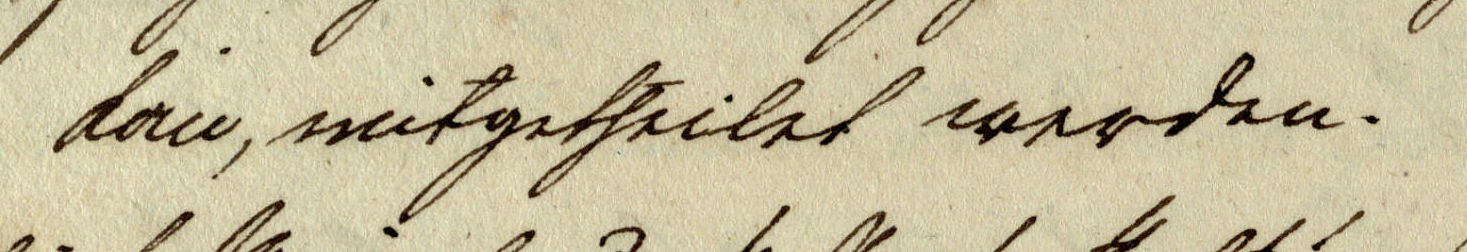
kan, mitgetheilet werden.
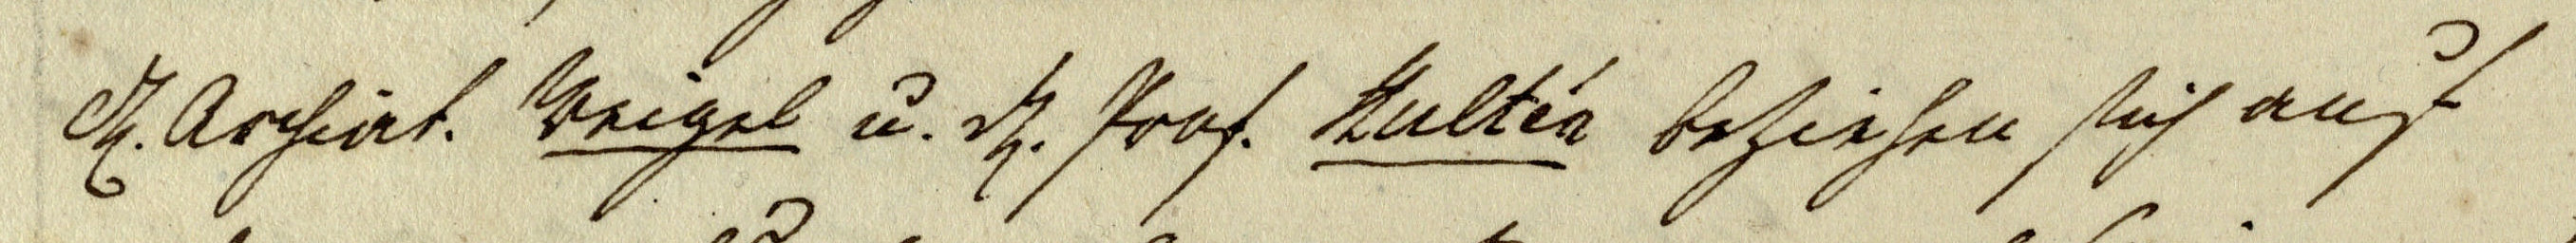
dh. Archiat. Weigel. u. dh. Prof. Hultén beziehen sich auf
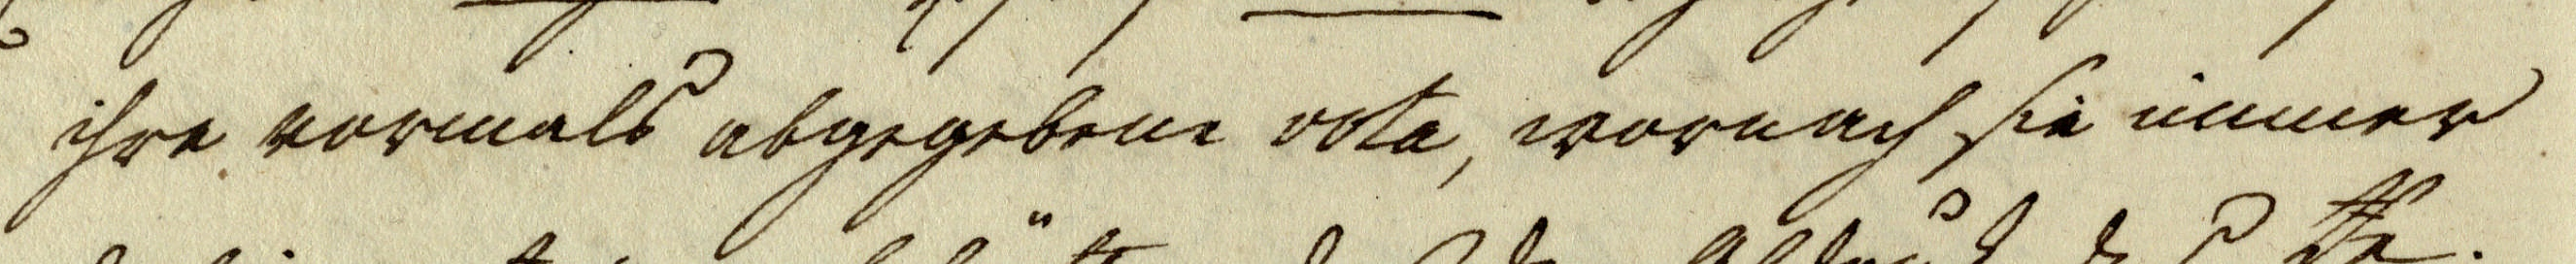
ihre vormals abgegebene vota, wornach sie immer
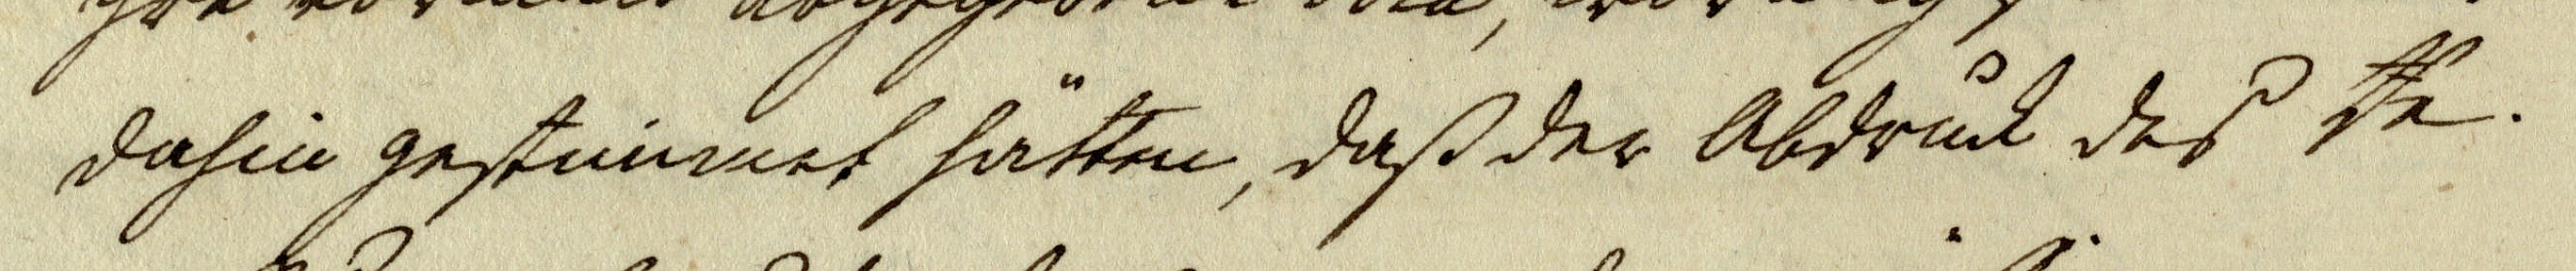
dahin gestimmet hätten, daß der Abdruck des Re¬
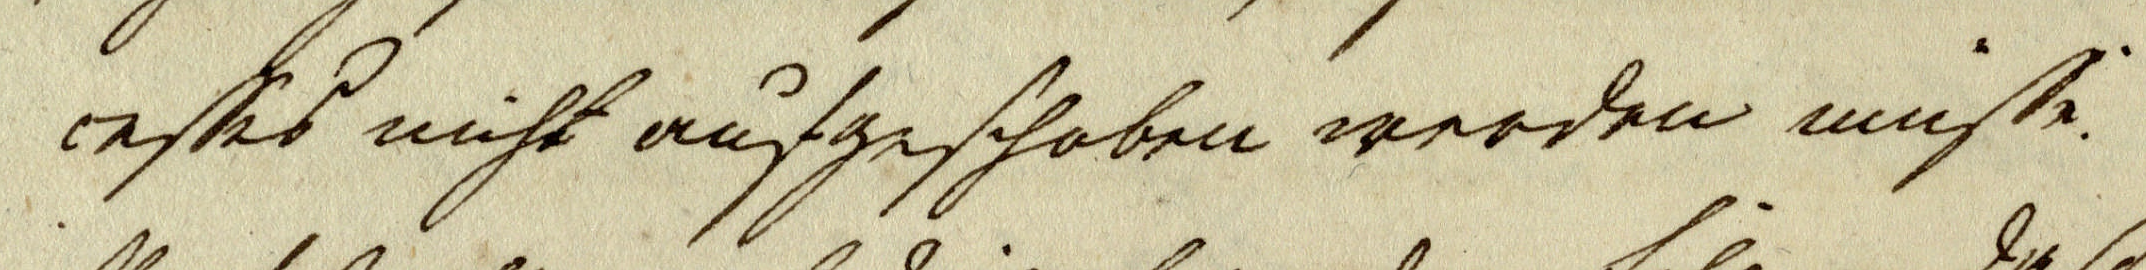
cesses nicht aufgeschoben werden müsse.
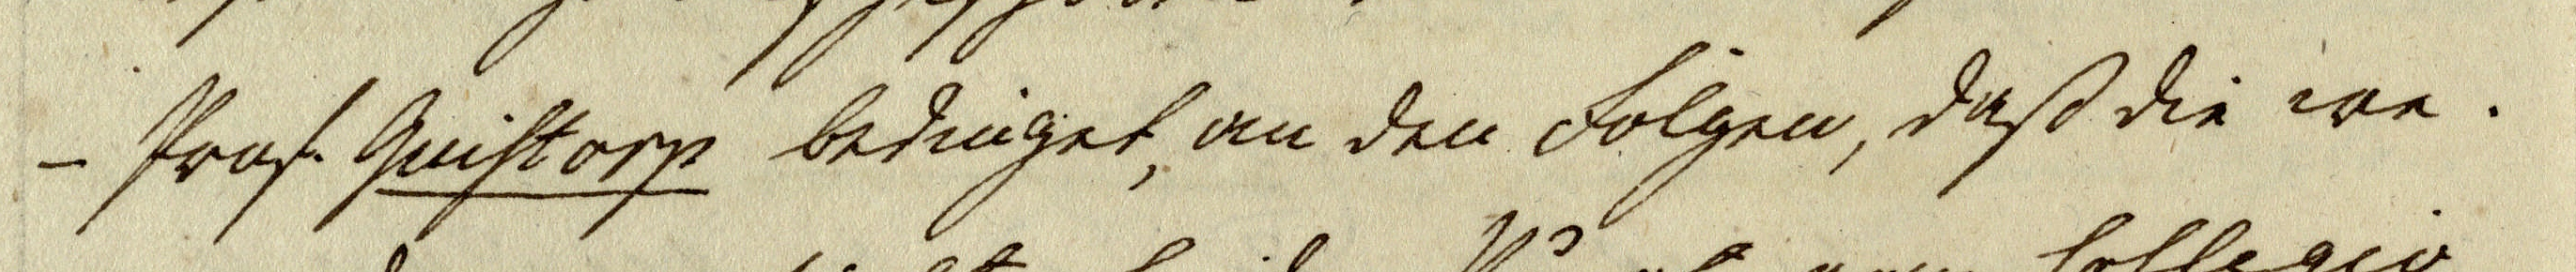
Prof. Quistorp bedinget, an den Folgen, daß die we¬
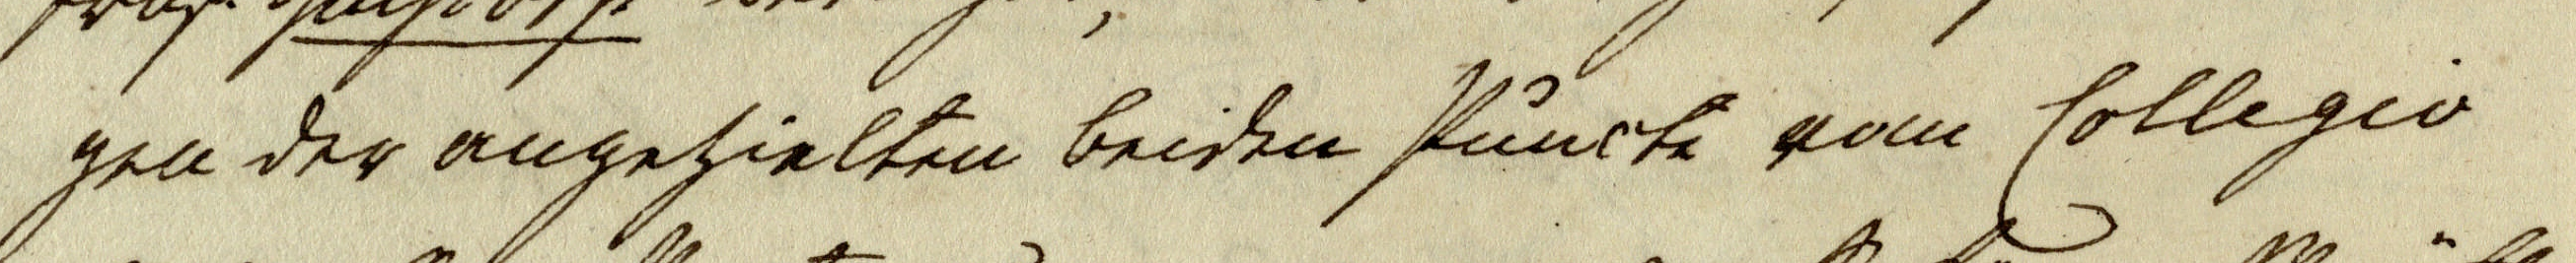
gen der angezielten beiden Puncte vom Collegio
